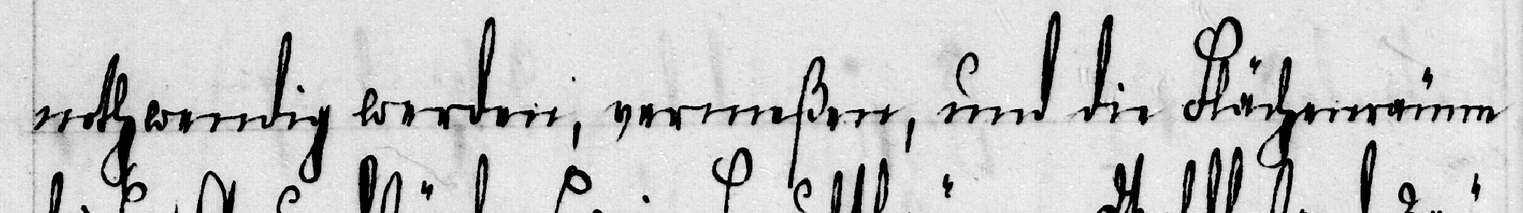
nothwendig werden, vermeßen, und die Flächenräume
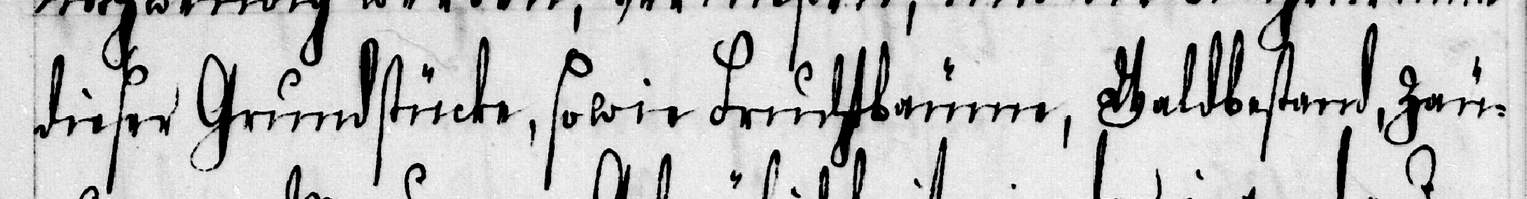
dieser Grundstücke, sowie Fruchtbäume, Waldbestand, Zäu¬
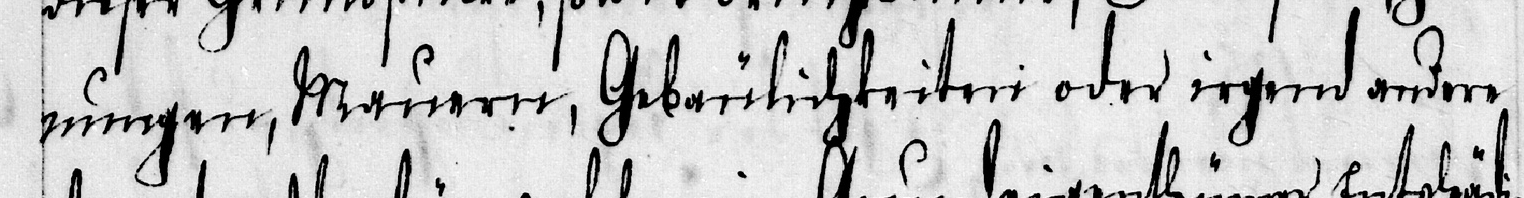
nungen, Mauern, Gebäulichkeiten oder irgend andere
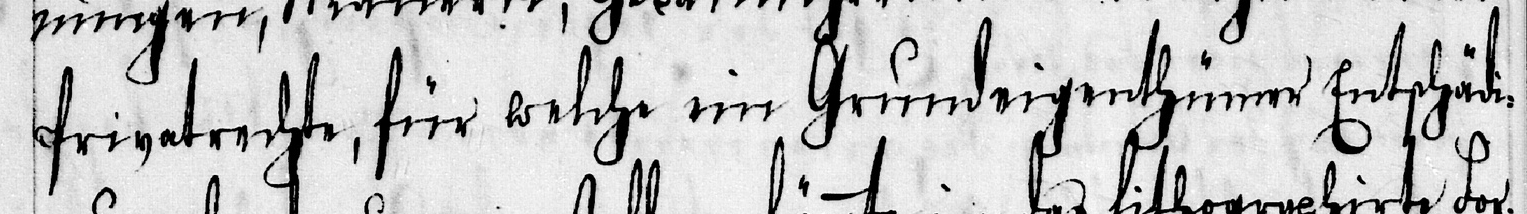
Privatrechte, für welche ein Grundeigenthümer Entschäd¬
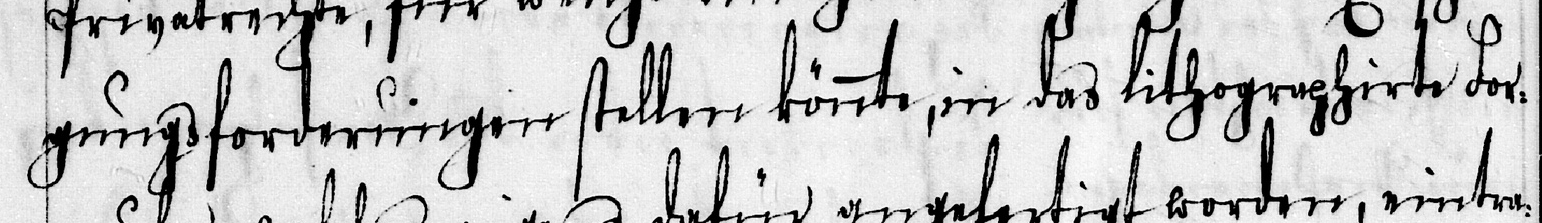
igungsforderungen stellen könnte, in das lithographirte For¬
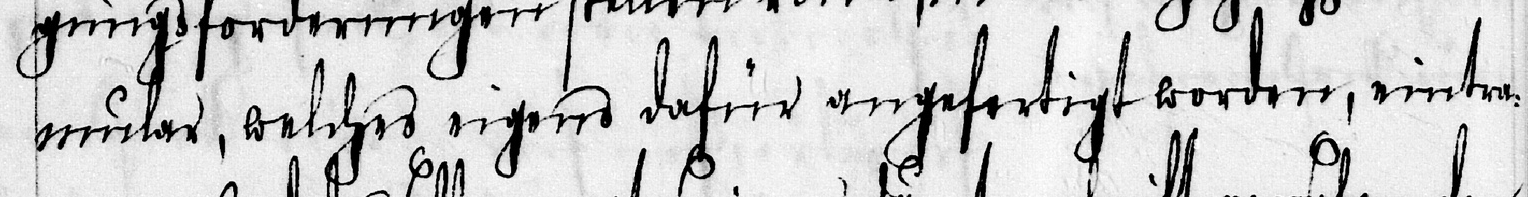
mular, welches eigens dafür angefertigt worden, eintr¬
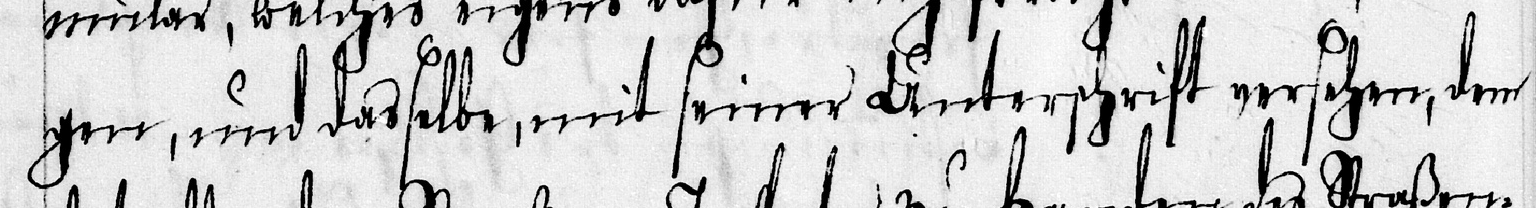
agen, und dasselbe, mit seiner Unterschrift versehen, dem
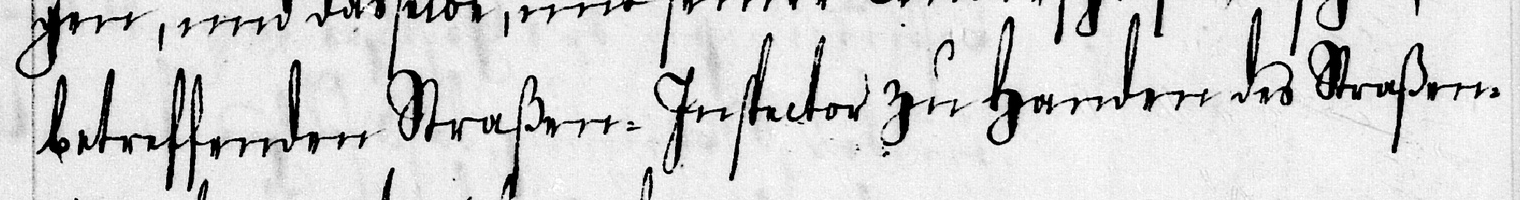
betreffenden Straßen-Inspector zu Handen des Straße¬
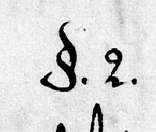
§. 2.
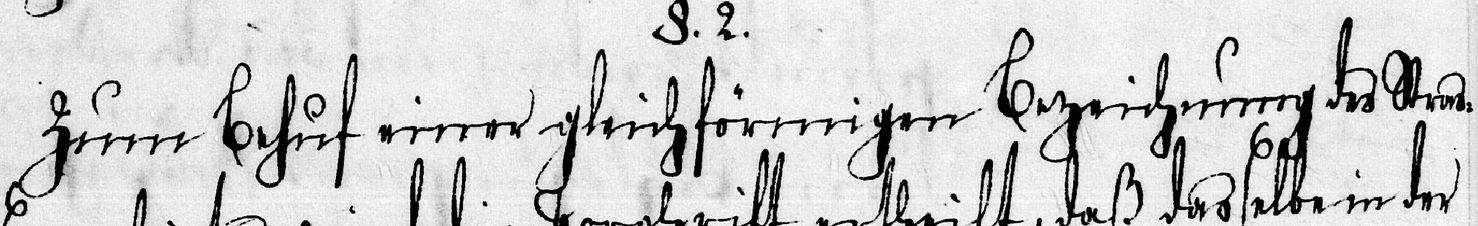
Zum Behuf einer gleichförmigen Bezeichnung des Stra¬
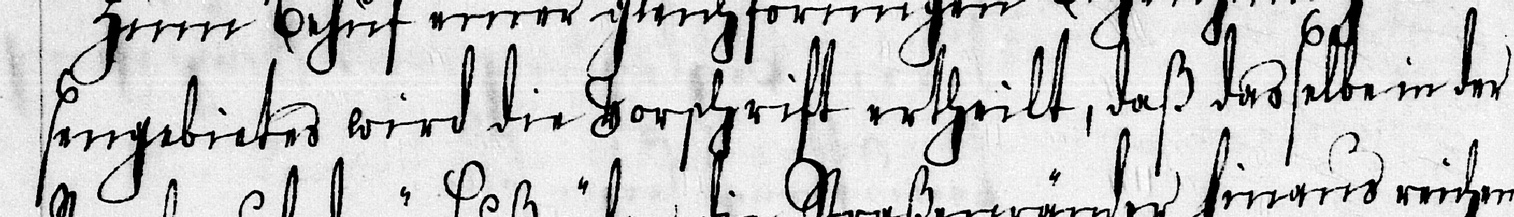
ßengebietes wird die Vorschrift ertheilt, daß dasselbe in der
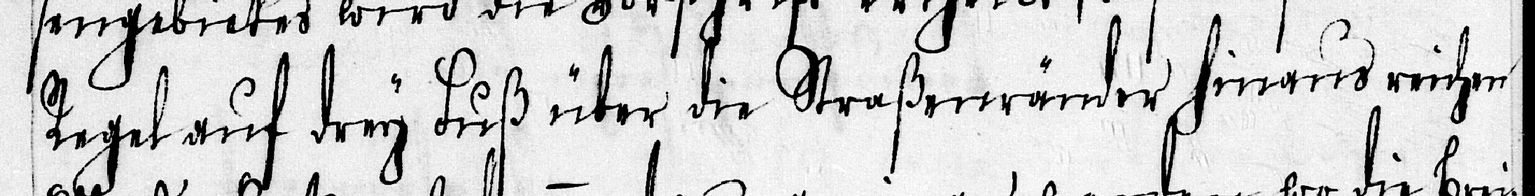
Regel auf drey Fuß über die Straßenränder hinaus reichen
